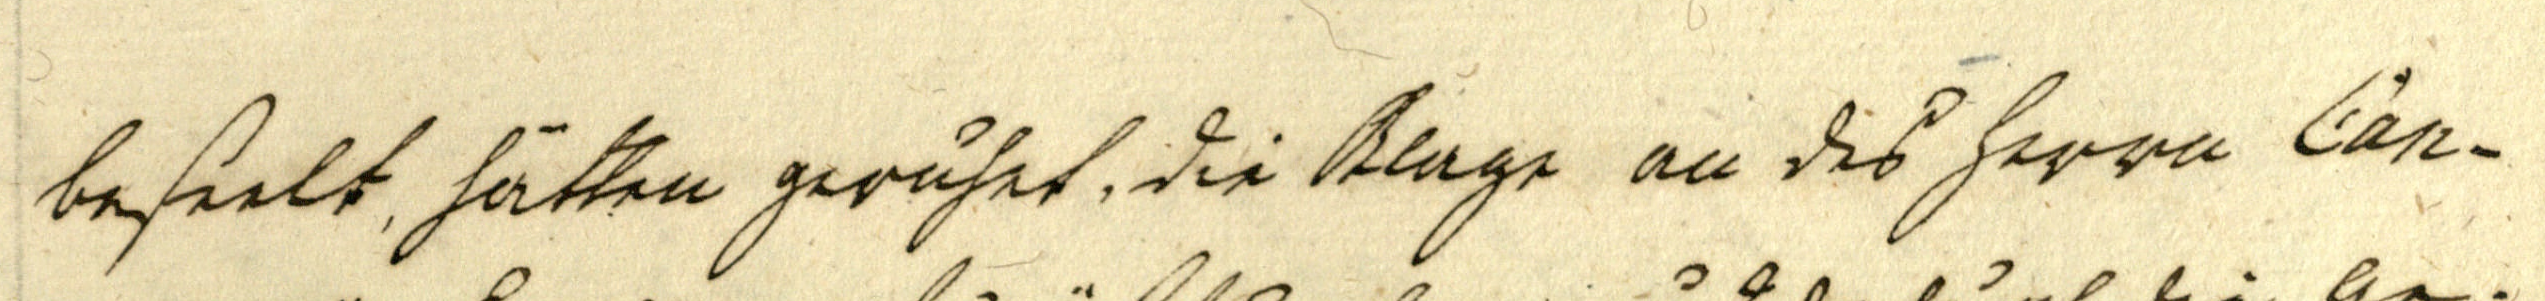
beseelt, hätten geruhet, die Klage an des Herrn Can¬
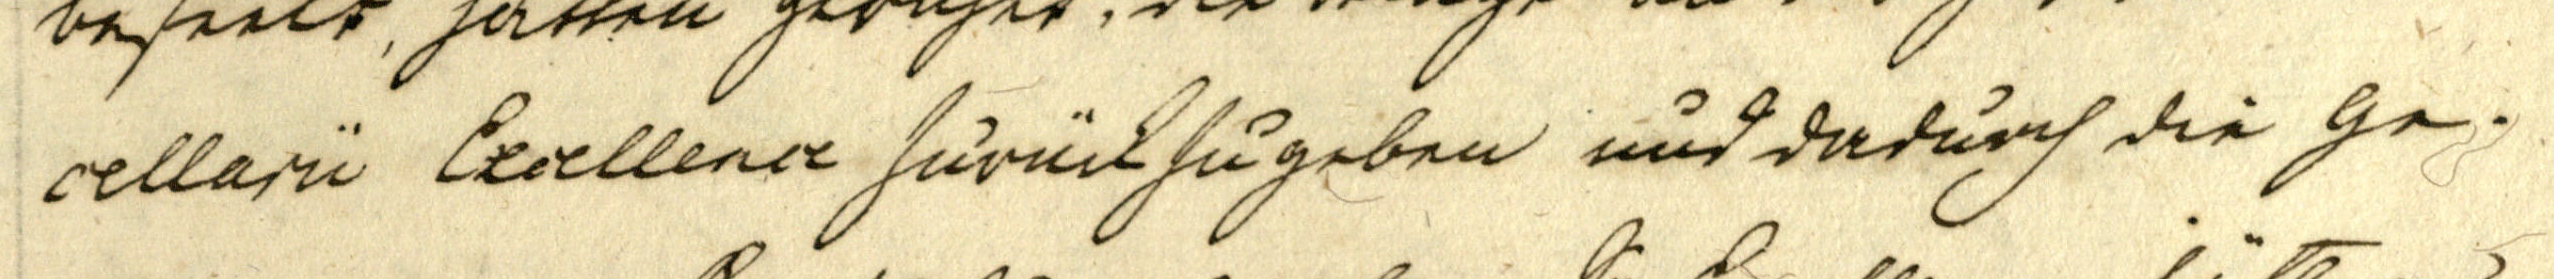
cellarii Excellence zurückzugeben und dadurch die Ge¬
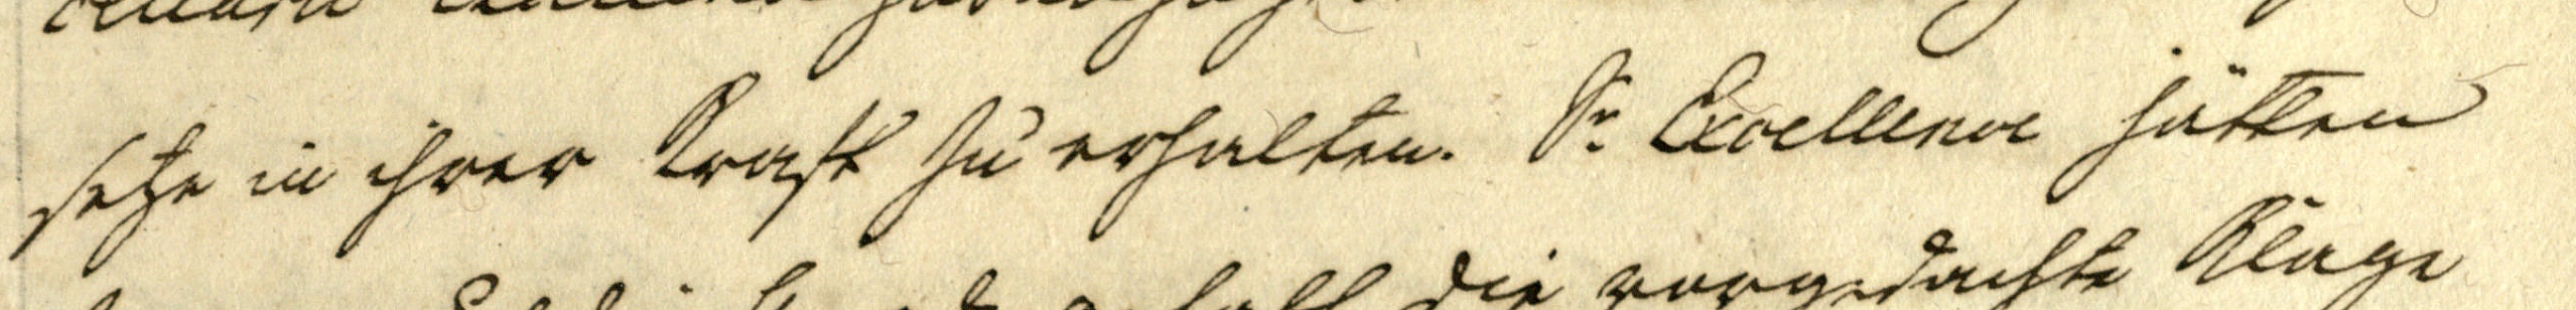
setze in ihrer Kraft zu erhalten. Sr Excellence hätten
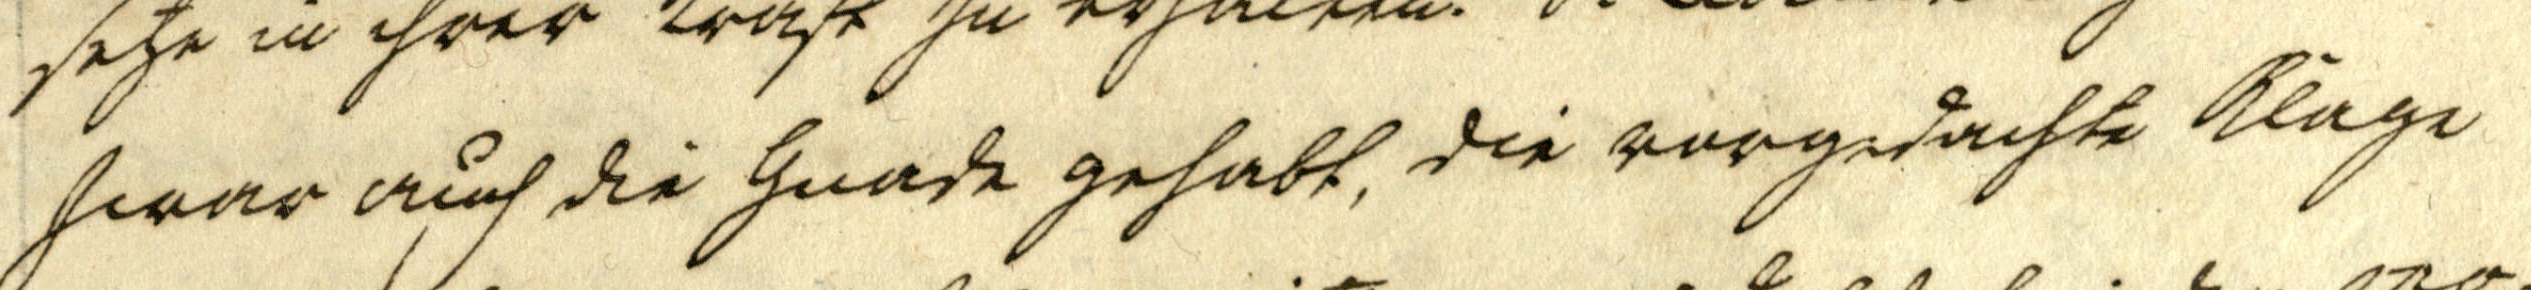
zwar auch die Gnade gehabt, die vorgedachte Klage
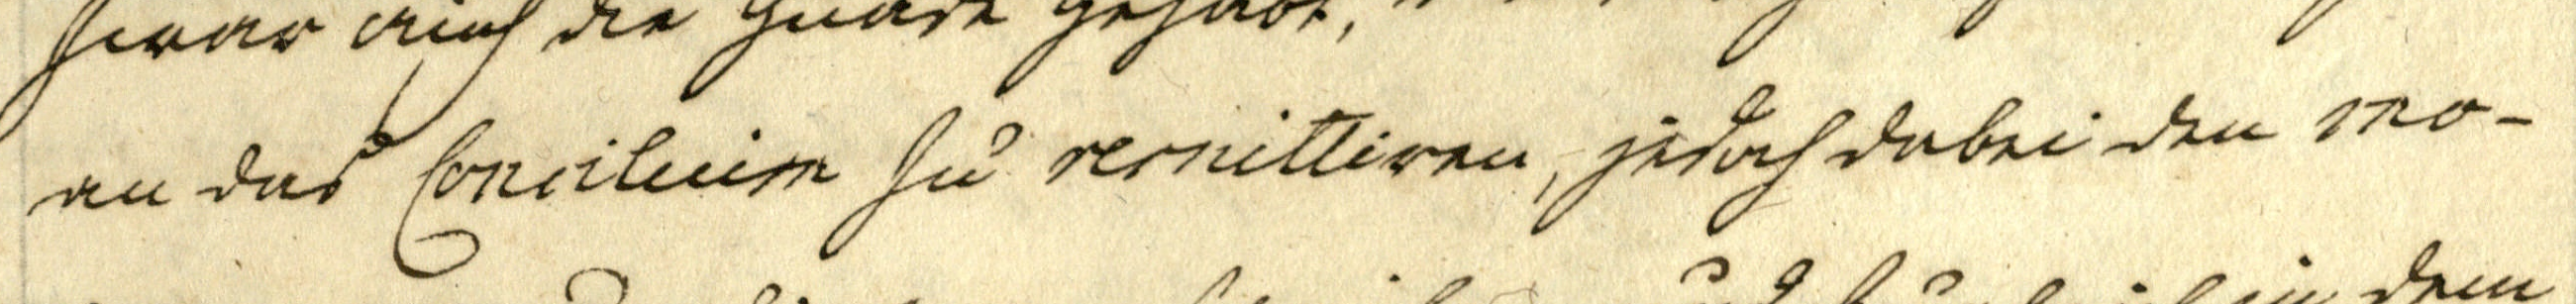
an das Concilium zu remittiren, jedoch dabei den mo¬
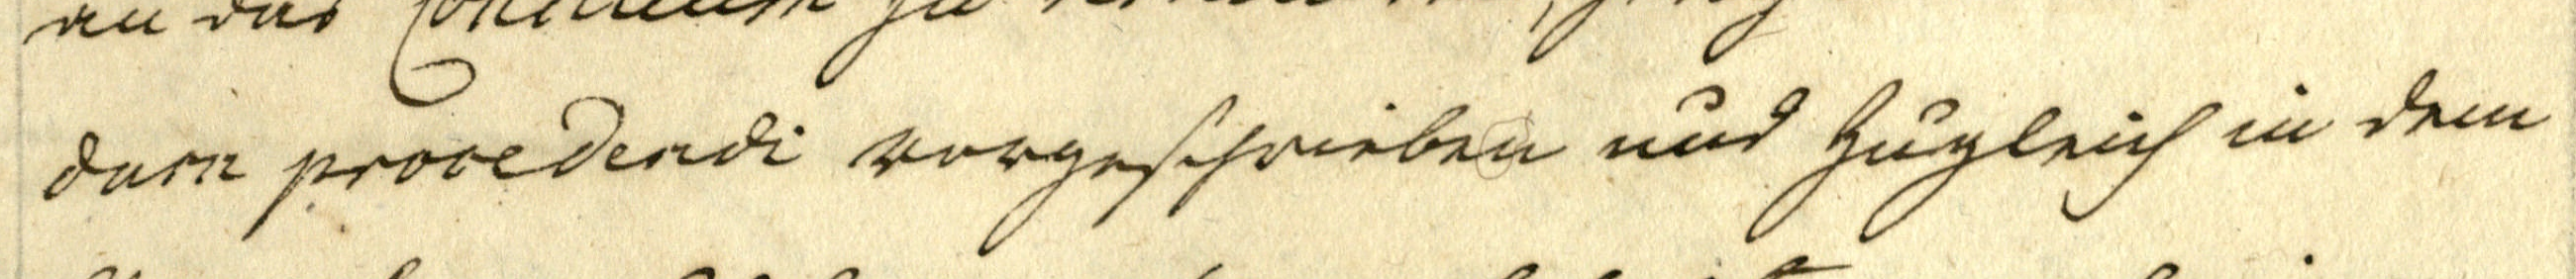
dum procedendi vorgeschrieben und zugleich in dem
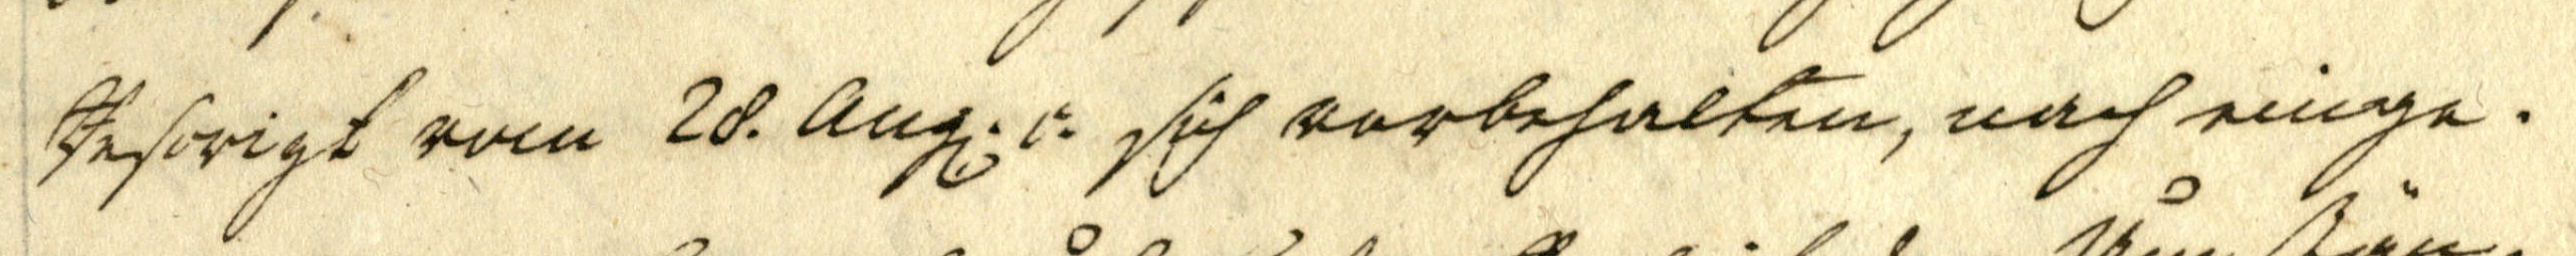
Rescript vom 28. Aug. c. sich vorbehalten, nach einge-
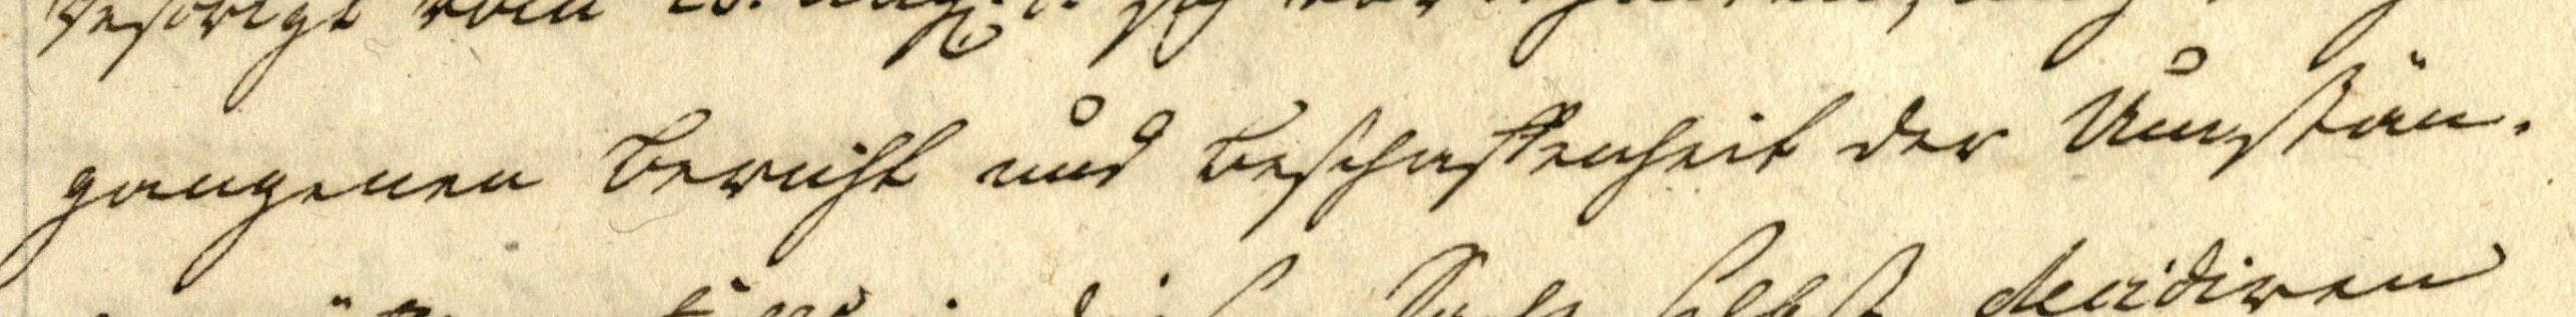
gangenen Bericht und Beschaffenheit der Umstän¬
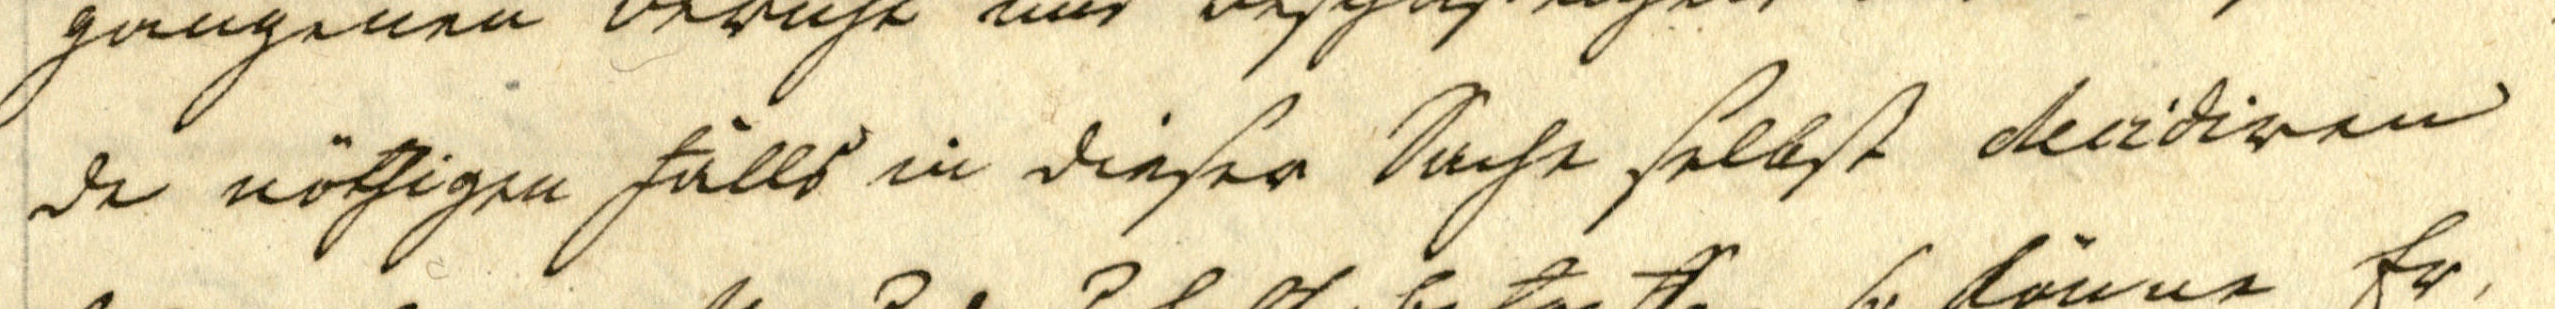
de nöthigen Falls in dieser Sache selbst decidiren
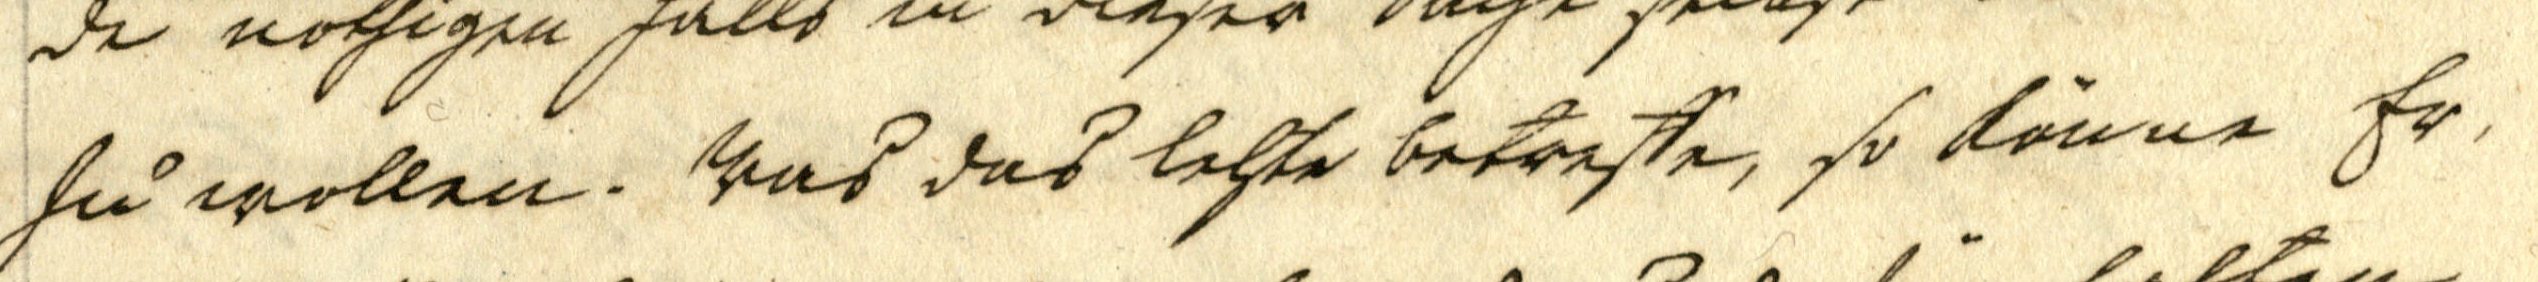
zu wollen. Was das letzte betreffe, so könne Er,
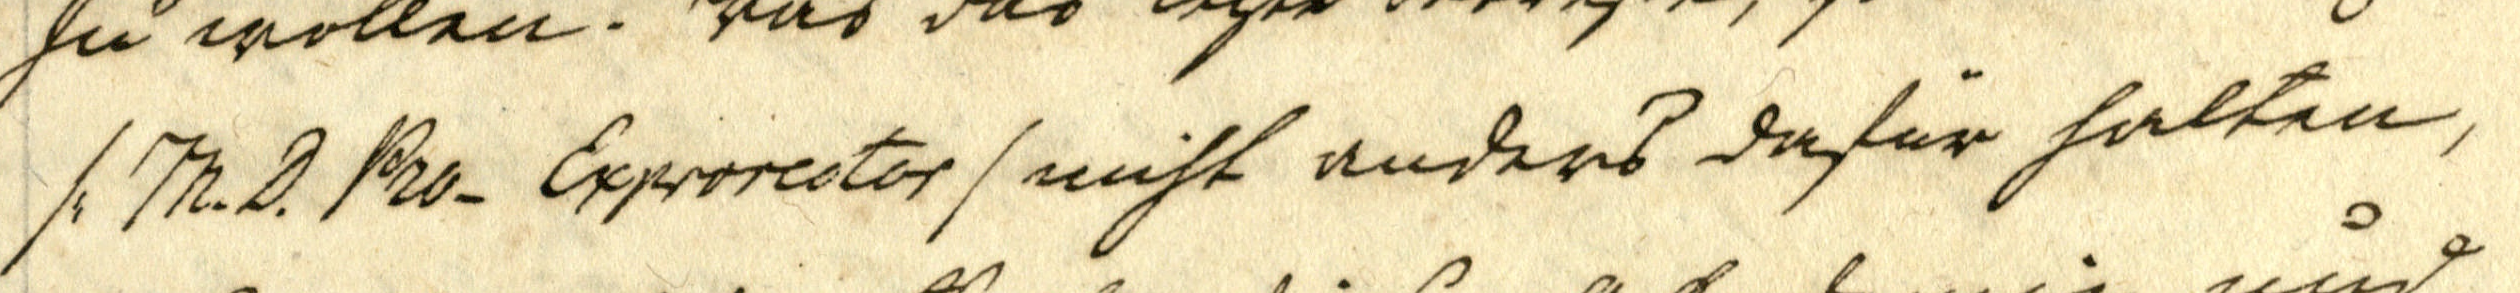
/. M. D. Pro. Exprorector / nicht anders dafür halten,
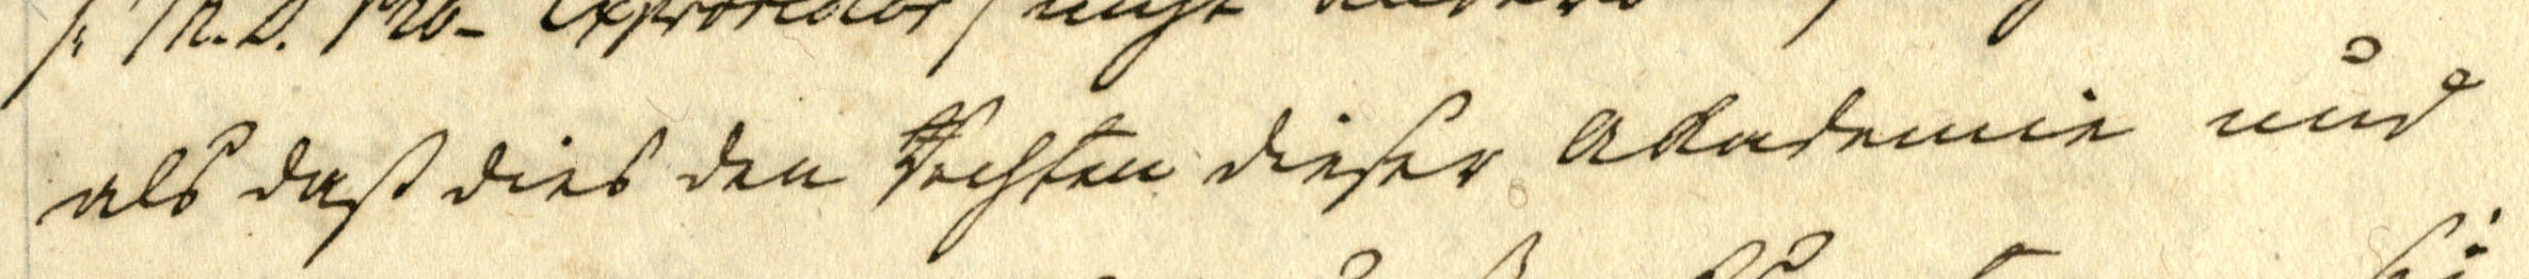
als daß dies den Rechten dieser Akademie und
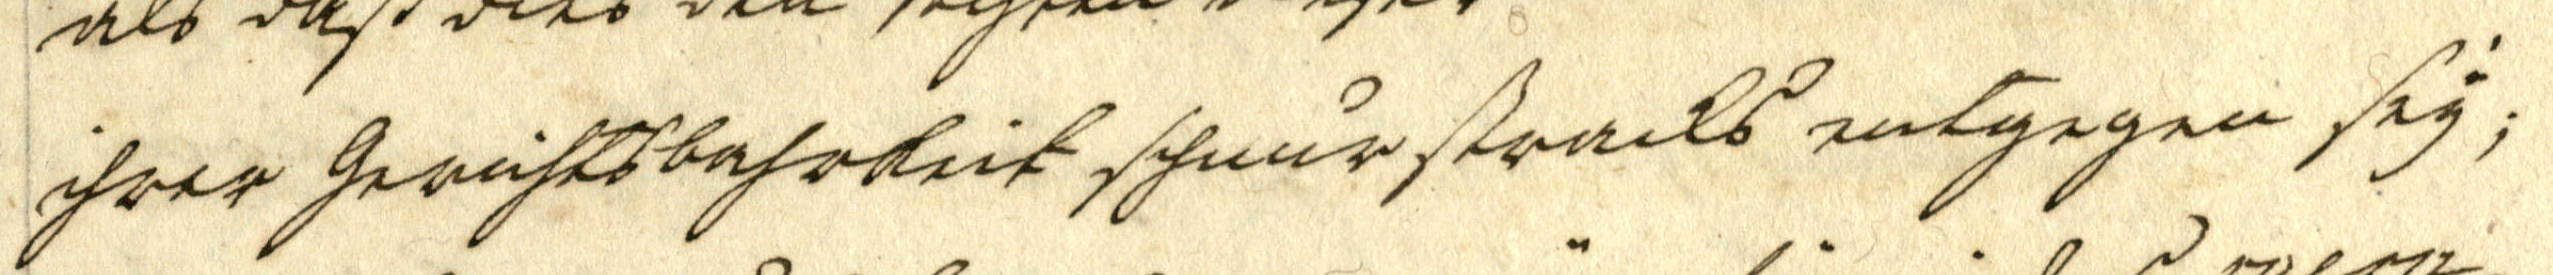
ihrer Gerichtsbahrkeit schnur stracks entgegen seÿ,
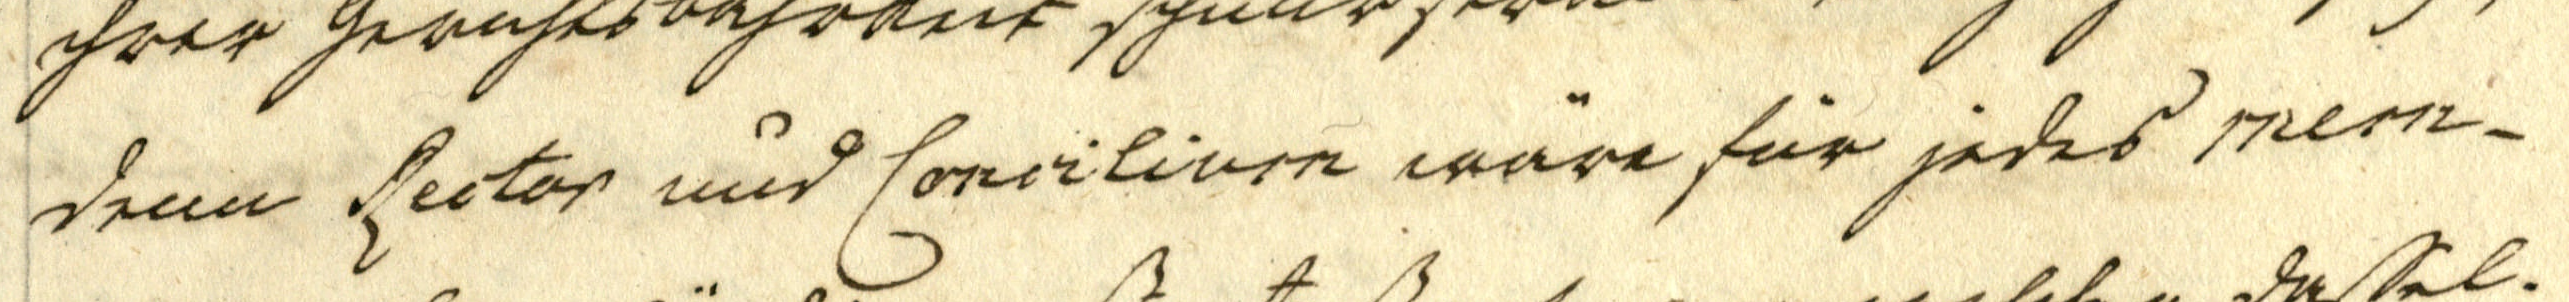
denn Rector und Concilium wäre für jedes mem¬
